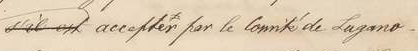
reussi à le faire accepter par le Comité de Lugano.
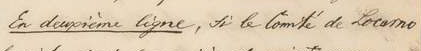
En deuxième ligne, si le Comité de Locarno
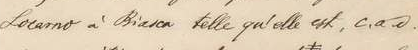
Locarno à Biasca telle qu'elle est, c. a. d.
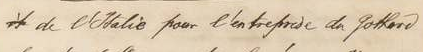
il de l'Italie pour l'entreprise du Gothard
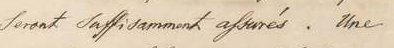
seront suffisamment assurés. Une
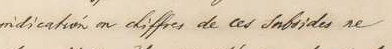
indication en chiffres de ces subsides ne
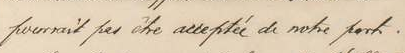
pourrait pas être acceptée de notre part.
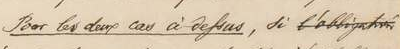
Pour les deux cas ci-dessus, si l'obligation
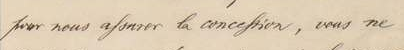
pour nous assurer la concession, vous ne
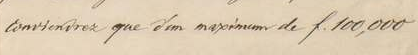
conviendrez que d'un maximum de f. 100,000
